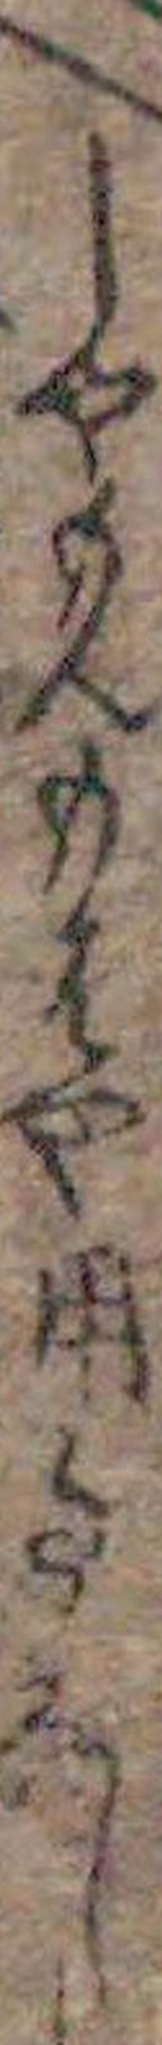しやもんもはや用事なしと
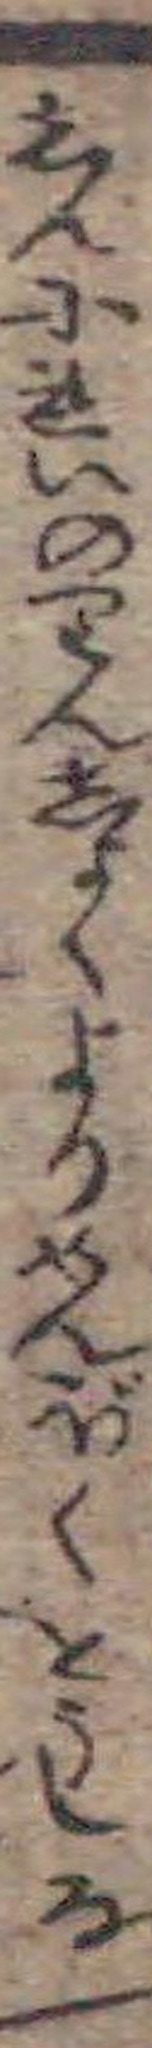しんにれいのりんしよくよりめんぼくをうしな
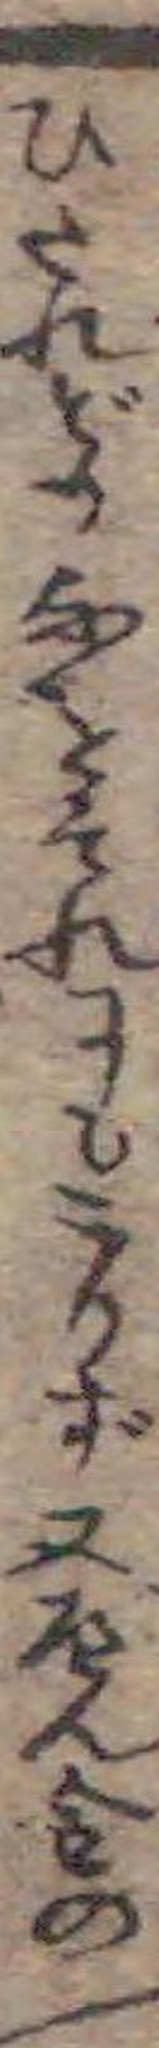ひたれどもなをそれにもこりず又へん金の
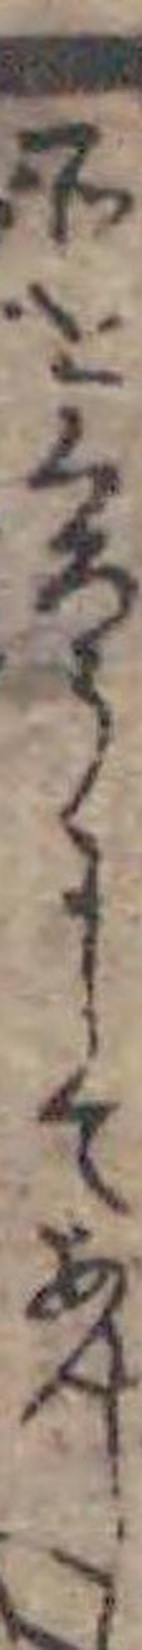所をくろうにしてあんじ
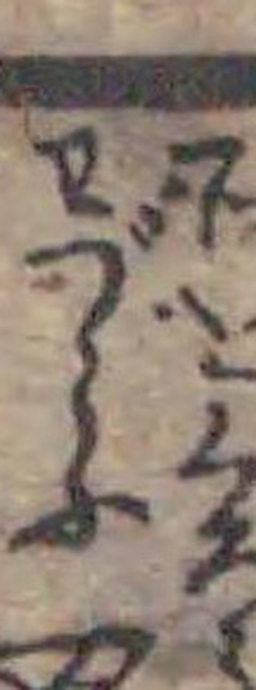わづらふ
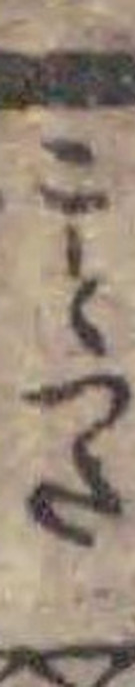ことつた
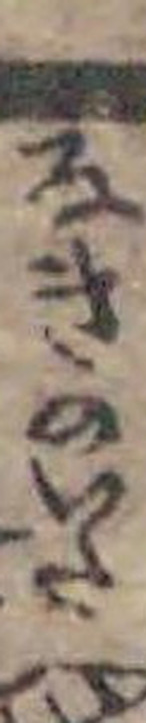なきのいた
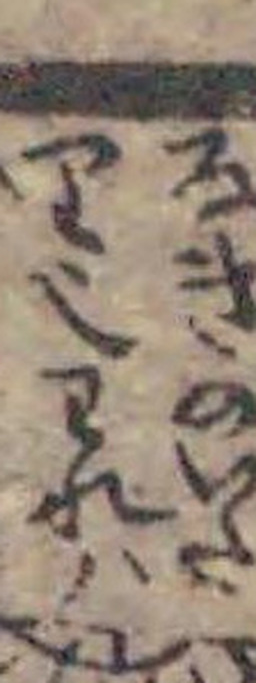り也われは
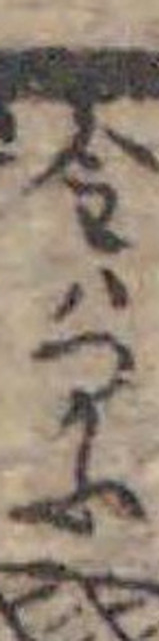金はつかふ
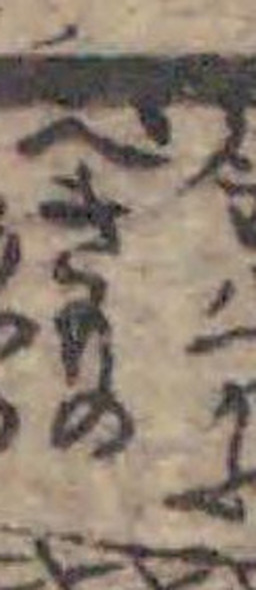べきもの
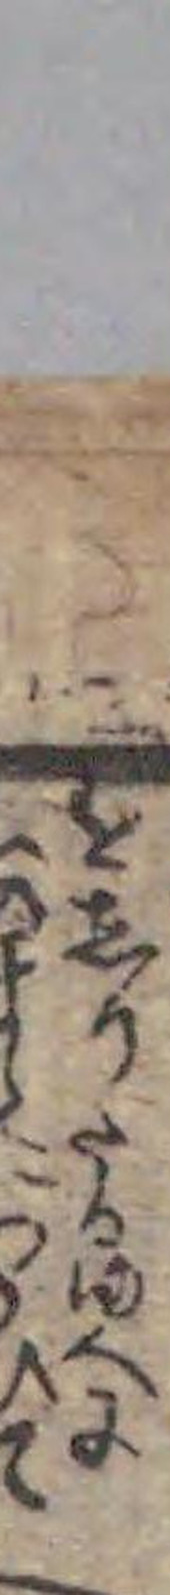をしりたるゆへに
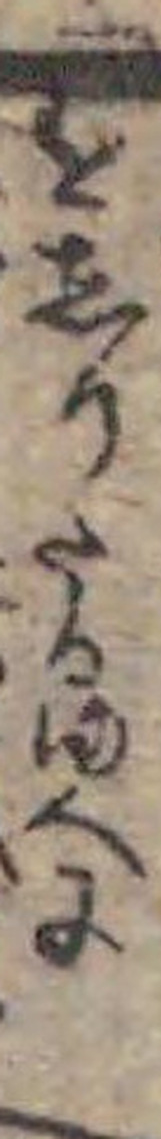をしりたるゆへに
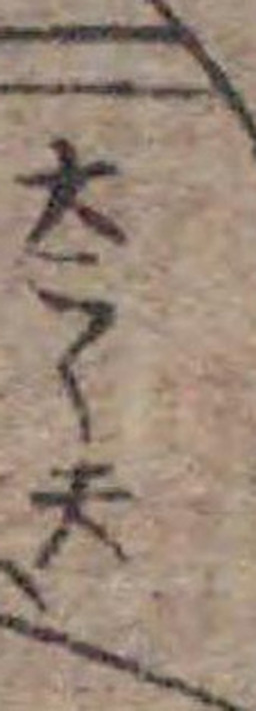大こく天
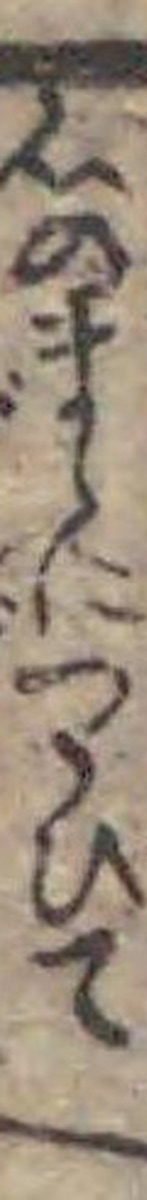心のまゝにつかひて
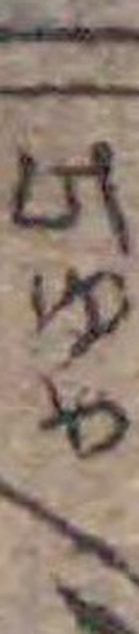此ゆめ
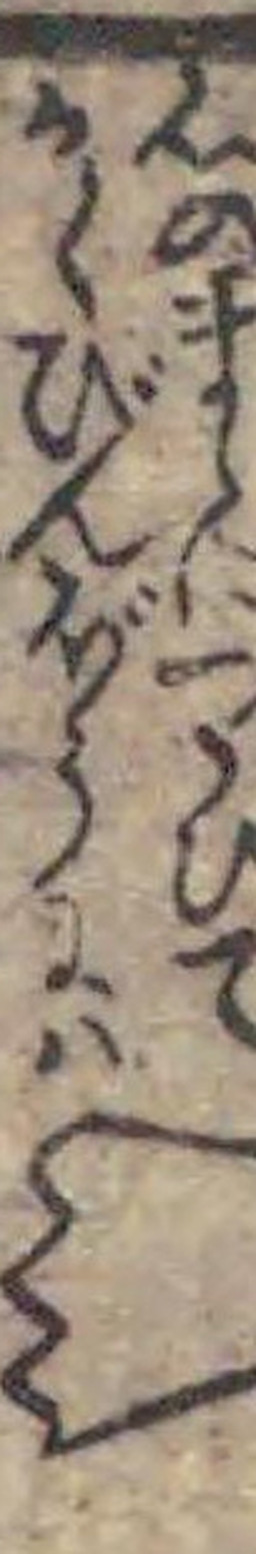かくびんぼうには
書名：蛭子大黒壮年過 : 2巻
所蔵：国立国会図書館 National Diet Library, JAPAN
